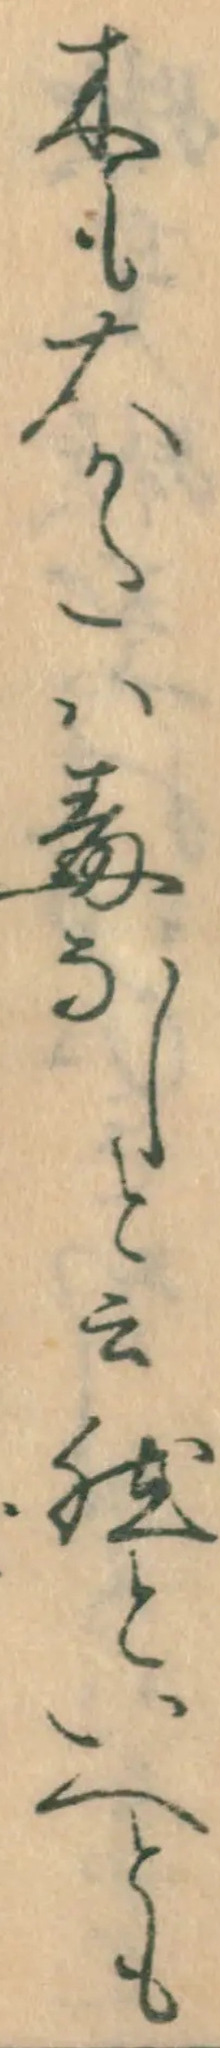木も大かたは毒なしと云然といへとも
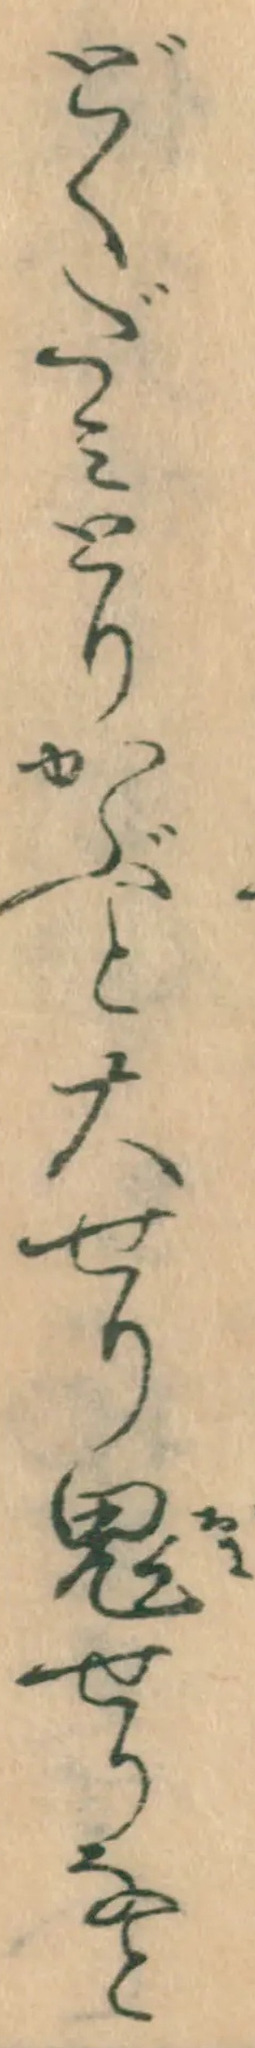どくだみとりかぶと大せり鬼せりなと
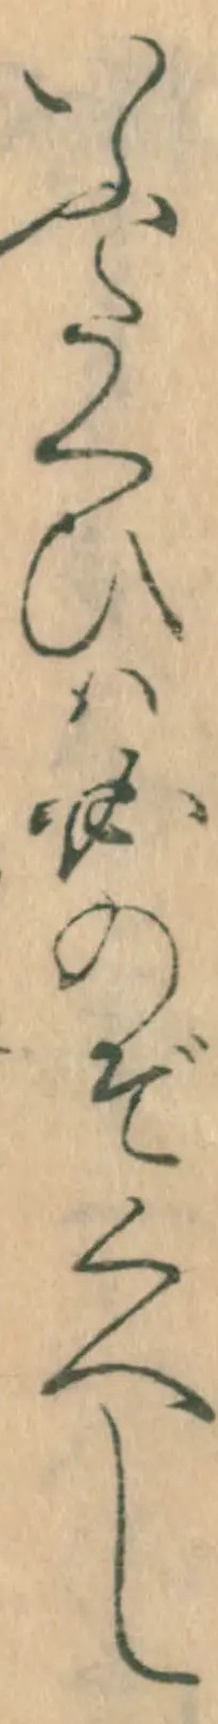いふたくひは必のぞくへし
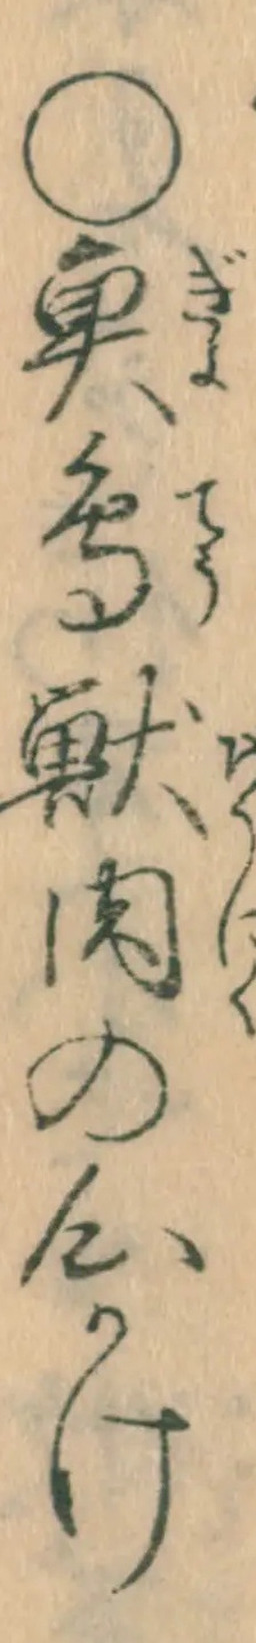○魚鳥獣肉の心かけ
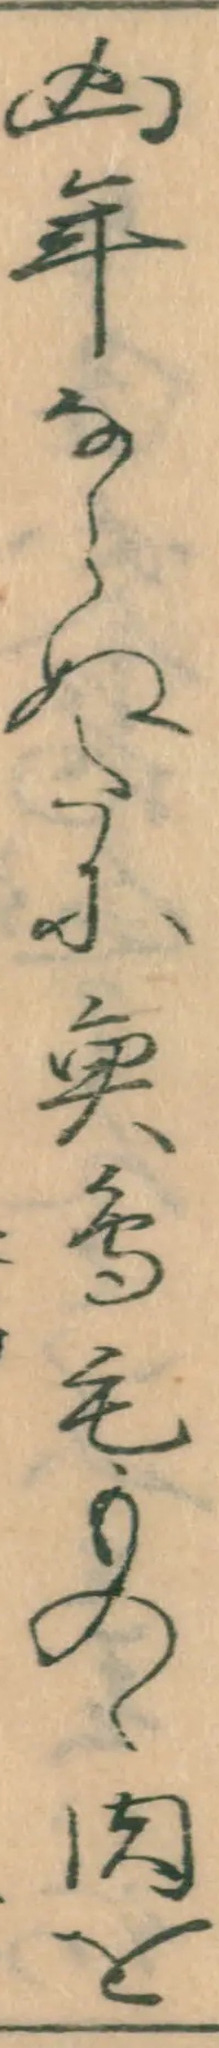凶年ならぬたに魚鳥毛ものゝ肉を
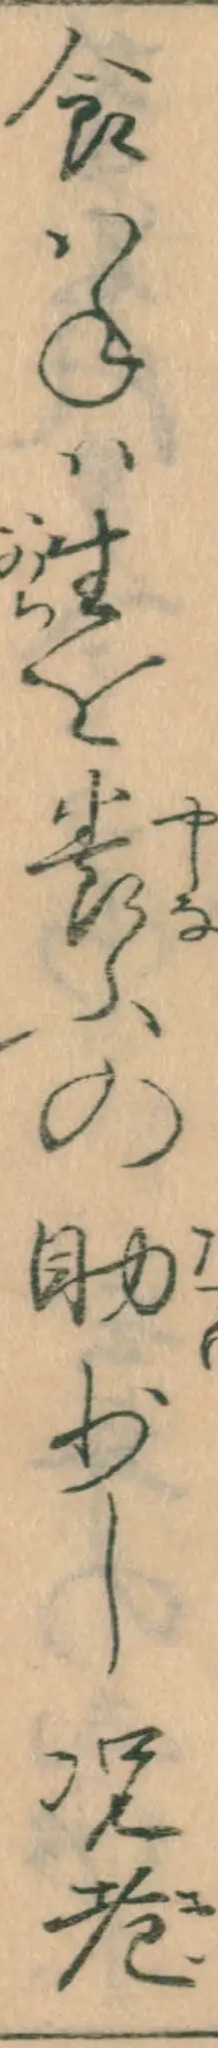食はねは生を養ふの助少し况老
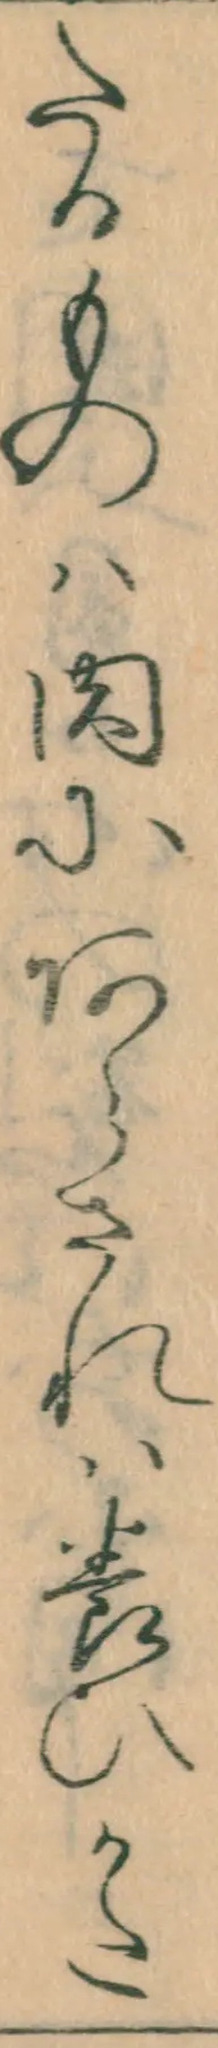たるものは肉にあらされは養ひかた
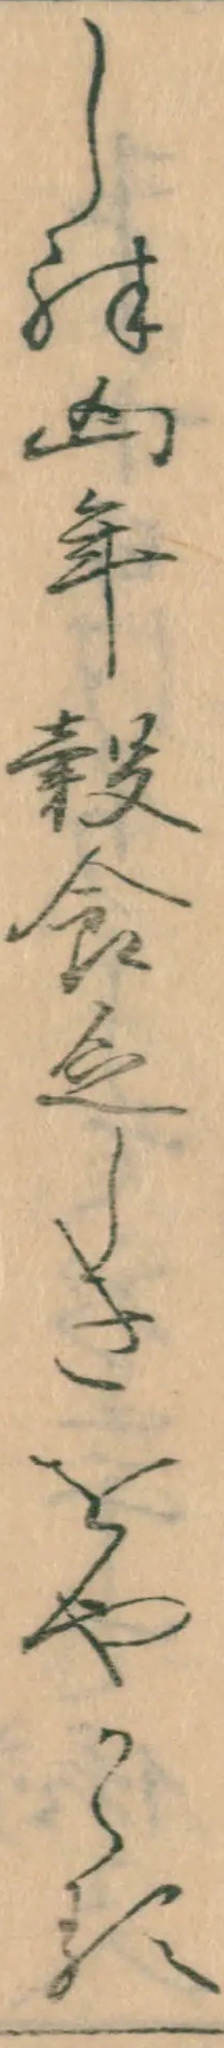し殊凶年穀食乏しきをやかゝる
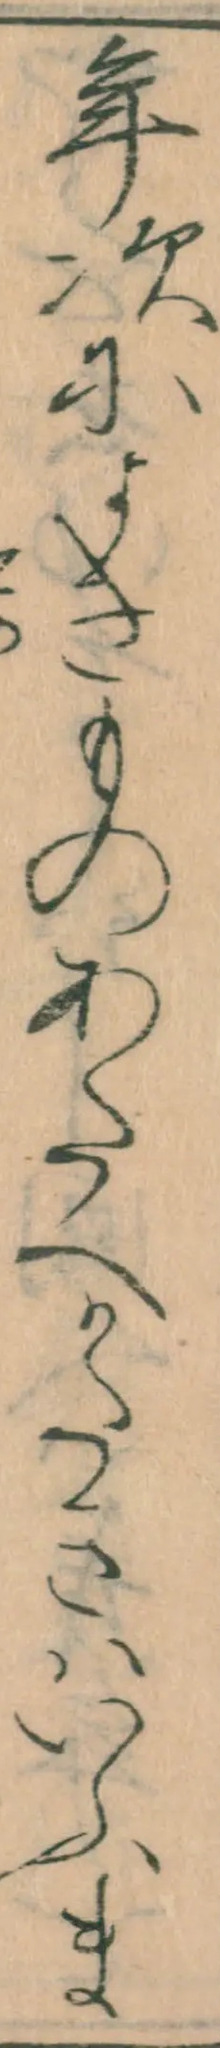年次によきものあたへかたきはいふま
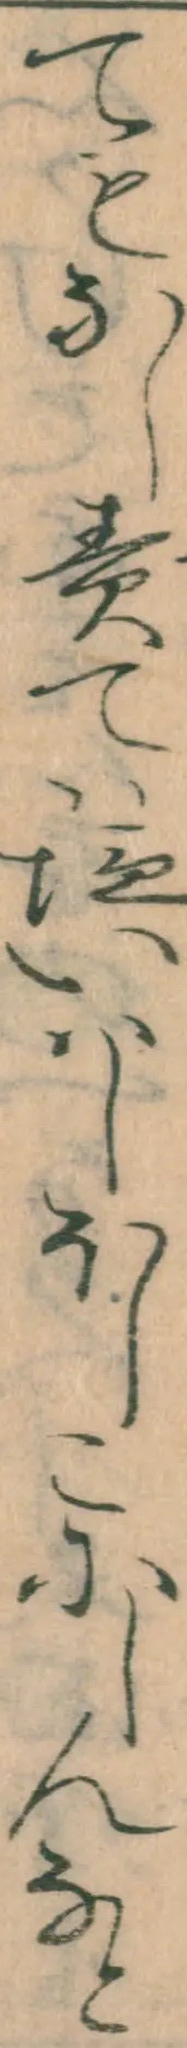てもなし責ては塩いはしほしこにしんなと
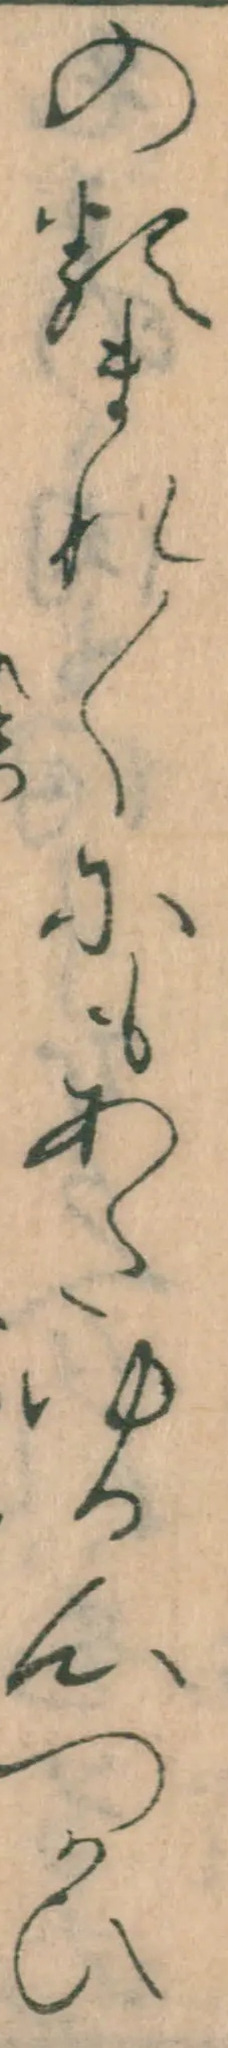の類まれ〳〵にもあたゆる心つかひ
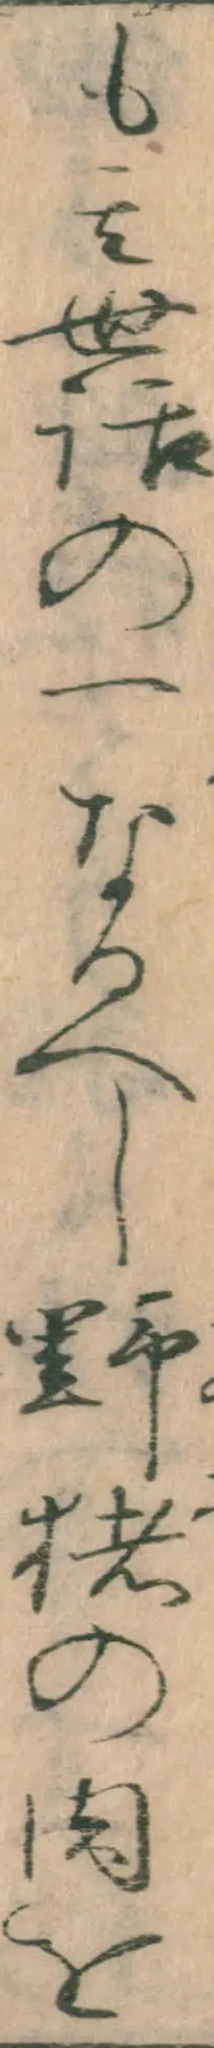も其世話の一なるへし野猪の肉を
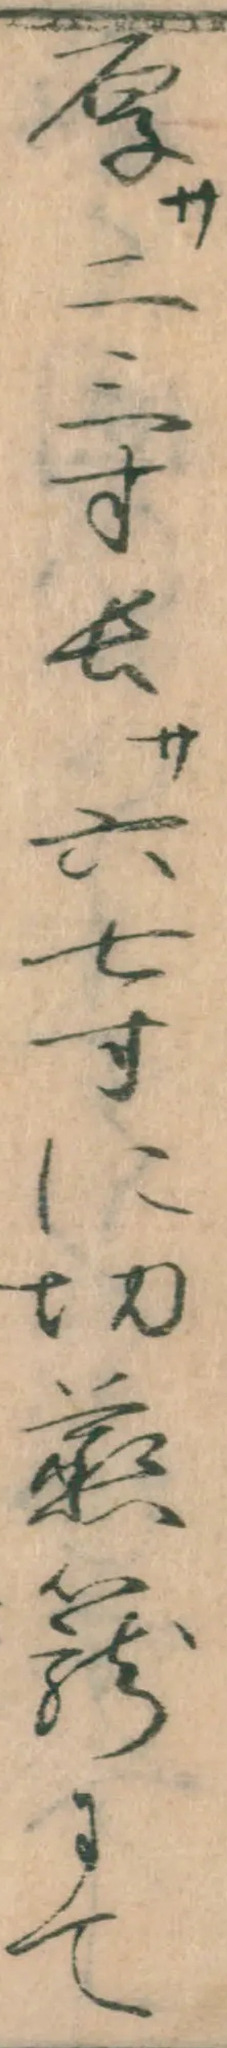厚サ二三寸長サ六七寸に切蒸篭にて
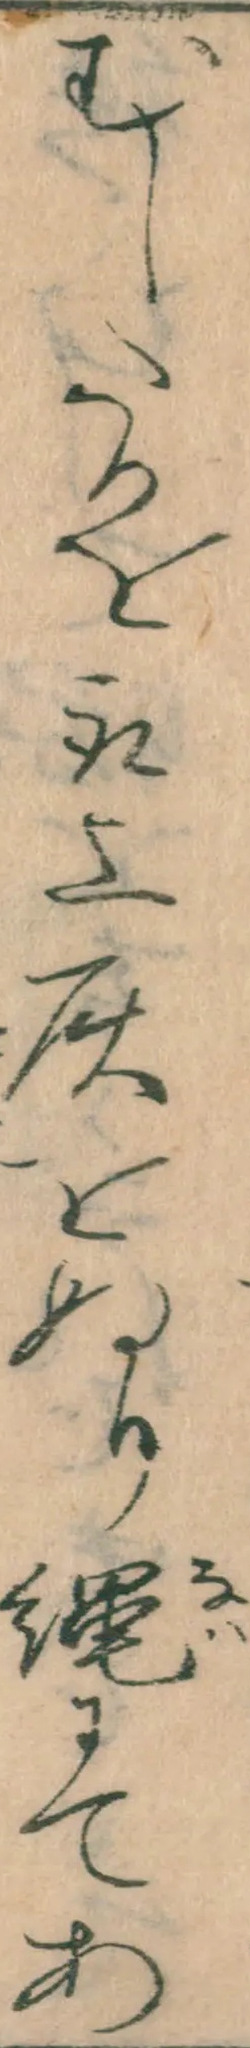むしたるを取上灰をぬり縄にてあ
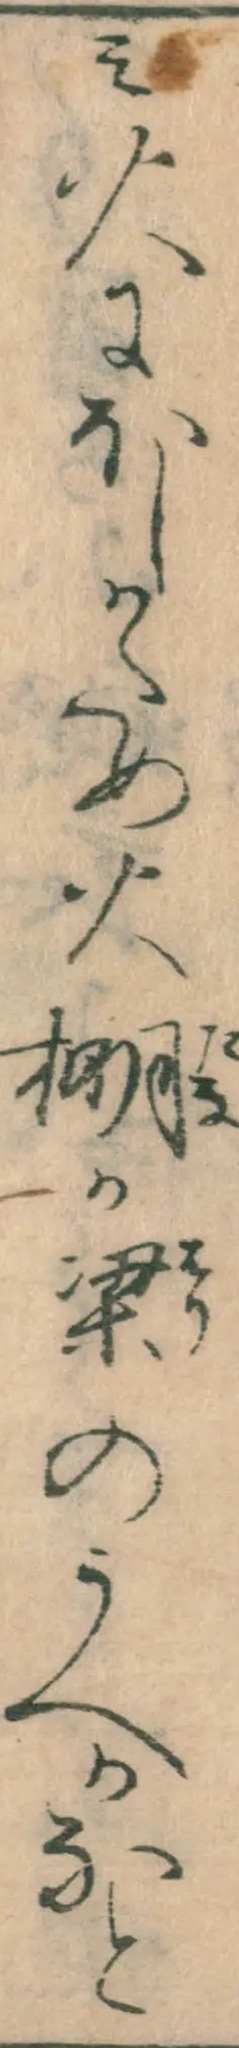み火にほしかため火棚か梁のうへかなと
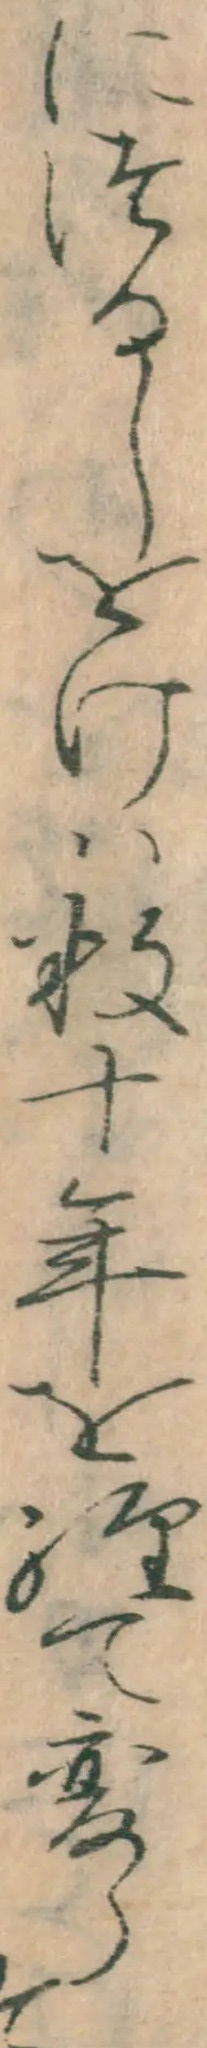につるしをけは数十年を経て変らす
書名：かてもの
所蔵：国立国会図書館 National Diet Library, JAPAN
